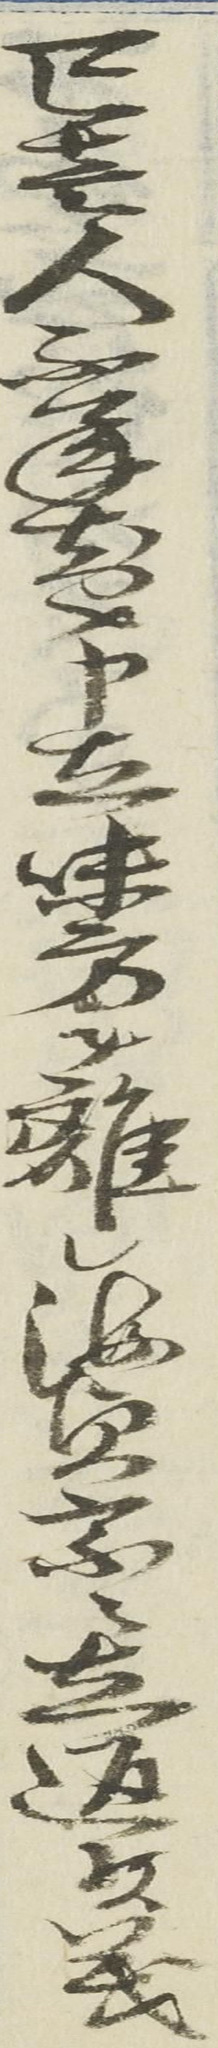己壱人不承知ヲ申立味方ヲ離レ海貞宗ニ立返候義
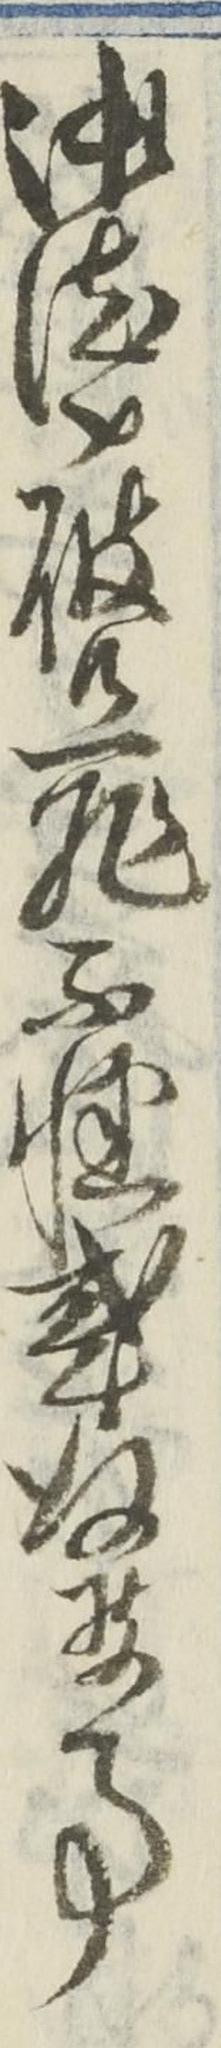御法ヲ破ル罪不軽奉存候事
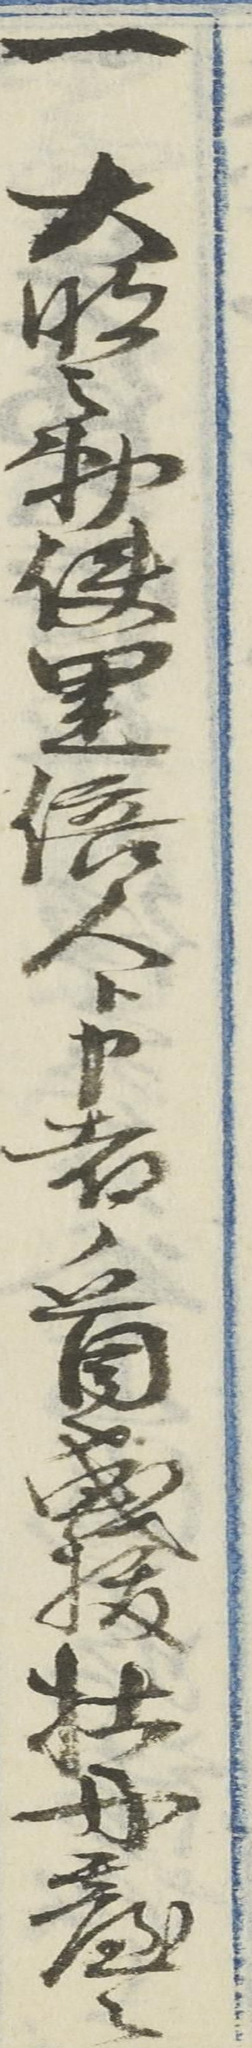一大明之勅使里倍人ト申者ノ首ヲ曳抜牡丹台ニ
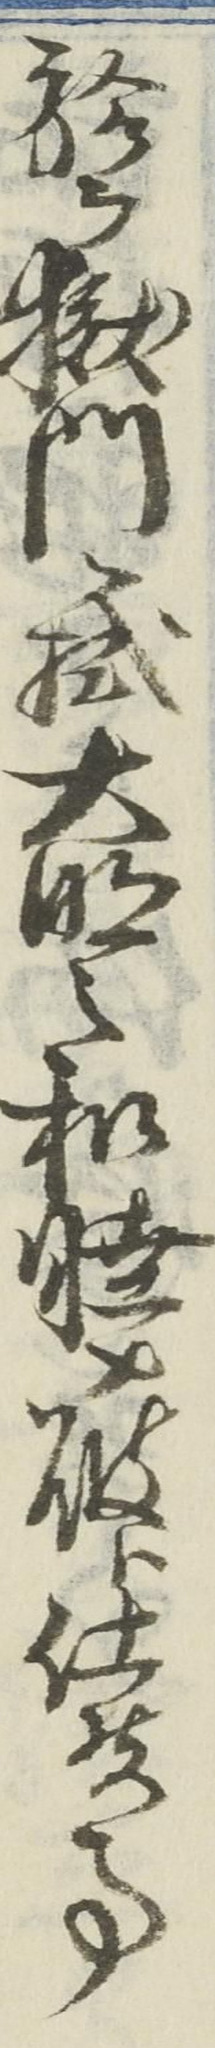於テ獄門ニ掛大明之和睦ヲ破ト仕候事
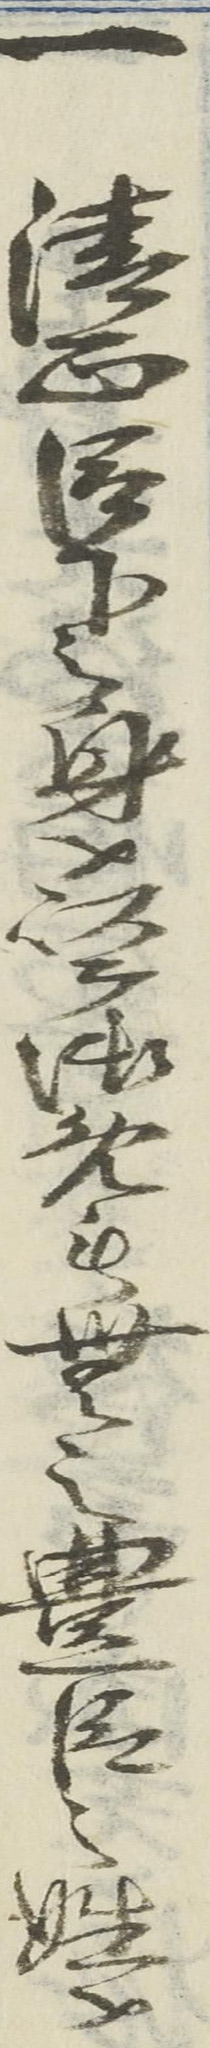一清正臣下之身ヲ以テ御免も無之豊臣之姓ヲ
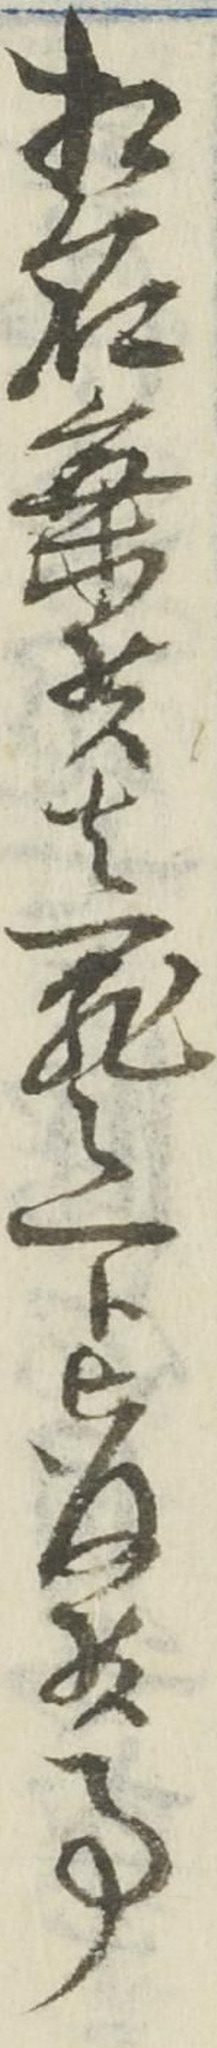相名乗候は罪之一ト被存候事
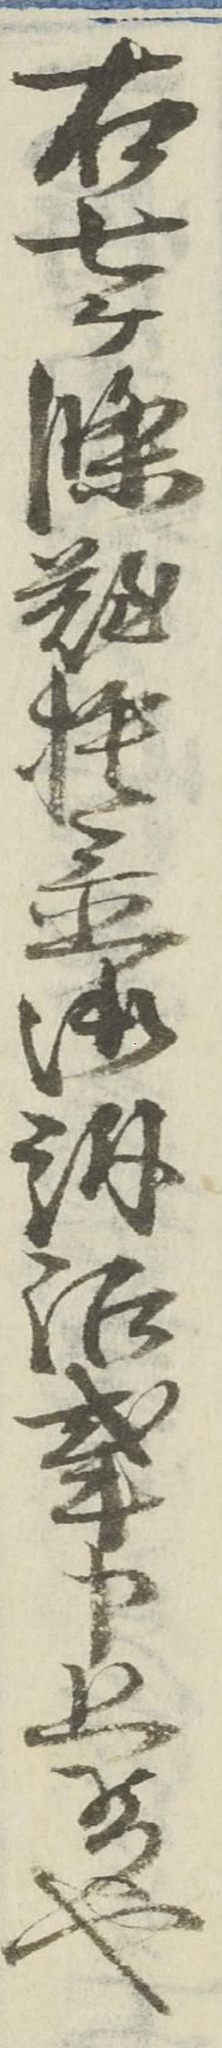右七ケ條難捨置御訴詔奉申上候也
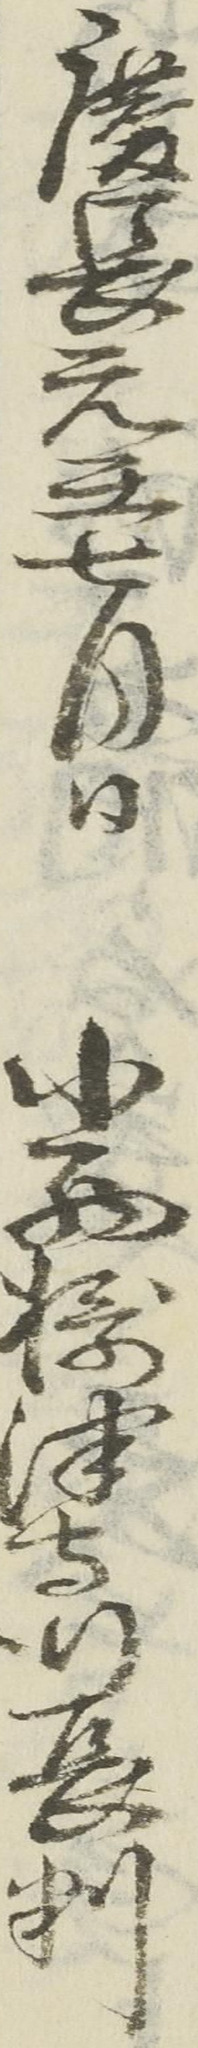慶長元壬七月日小西摂津津守行長判
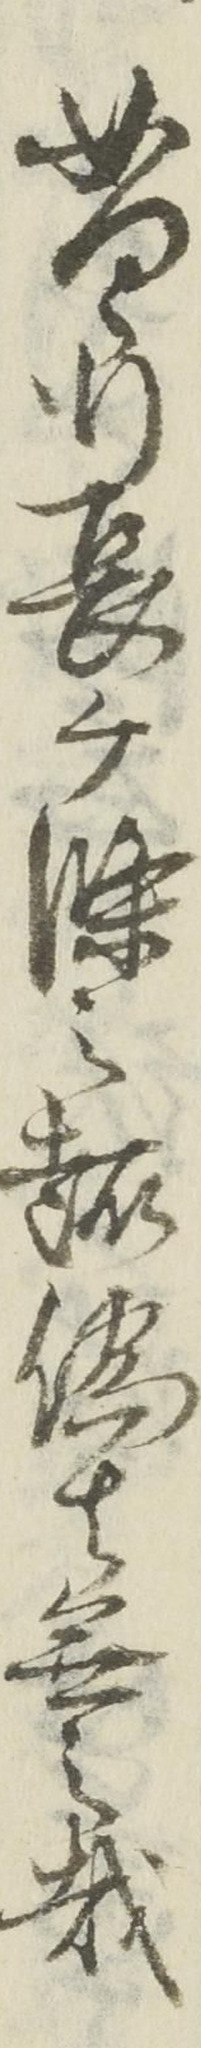片如何行長ケ條之趣偽は無之哉
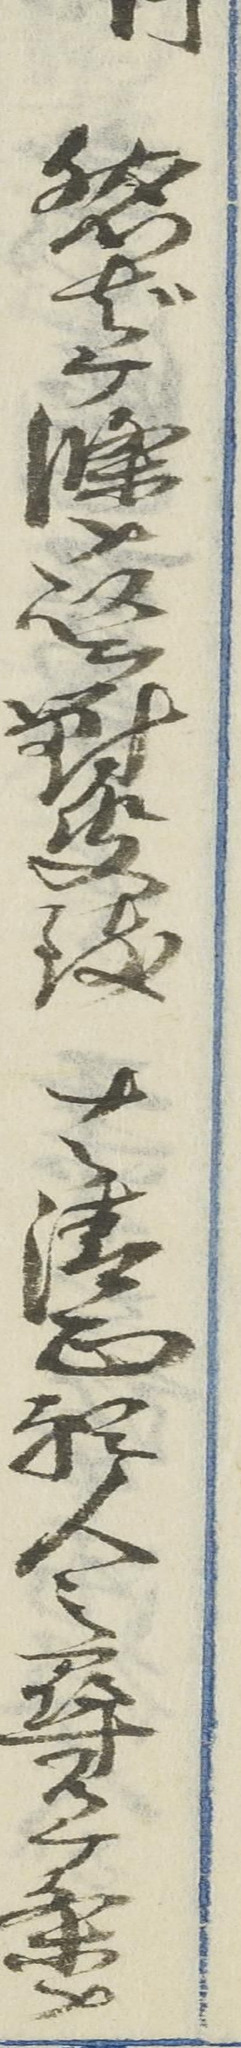片然ばケ條ヲ以テ対決致左清正願人之尋候ケ條ヲ
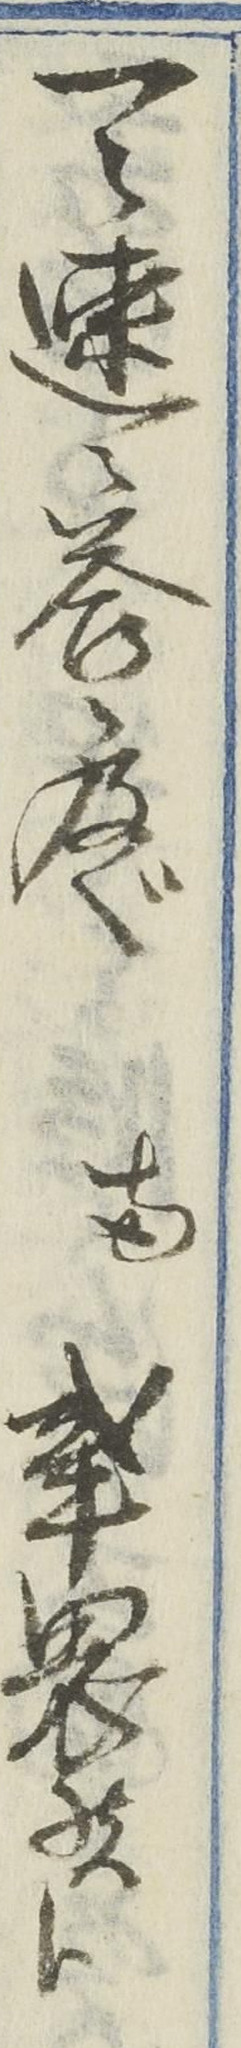一々速ニ答ニ及ベ両奉畏候ト
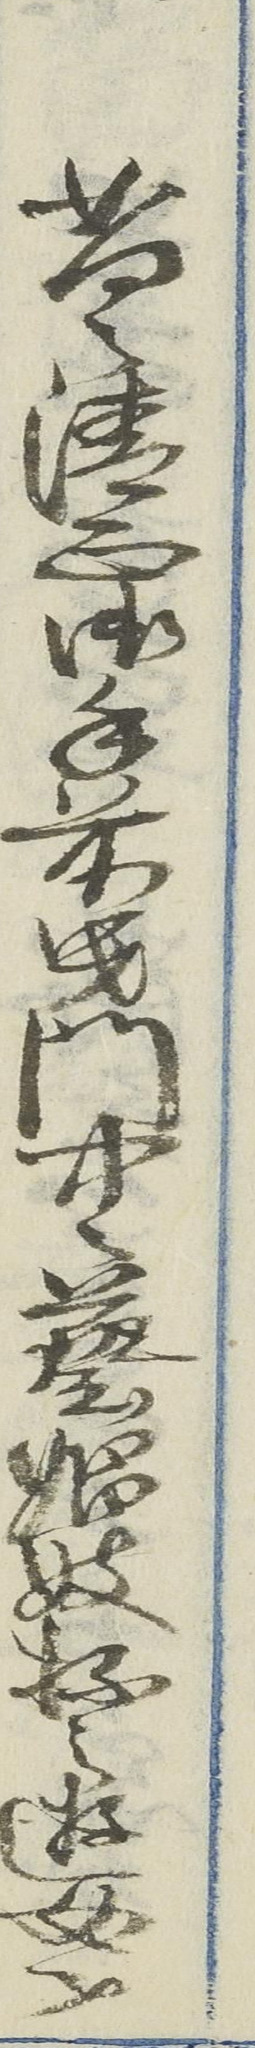小如何之清正御手前閉門中之芸娼妓抔之遊女ヲ
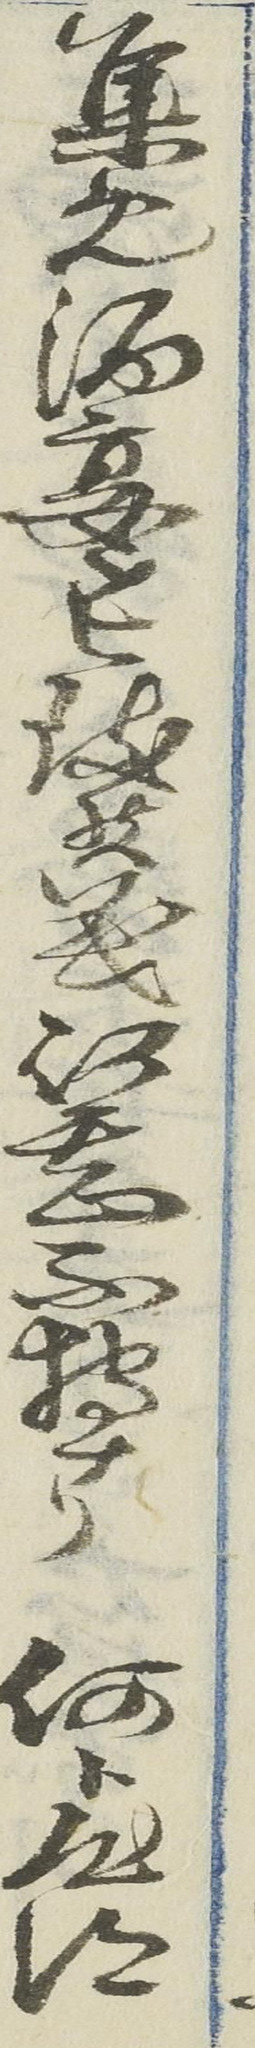集め酒宴ヲ被致候義以甚不埒ナリ何ト心得
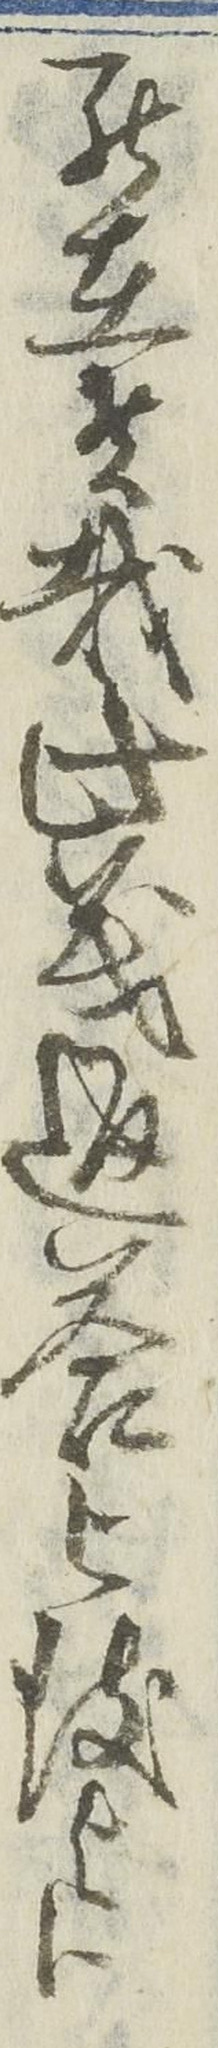罷在候哉此義返答被致よト
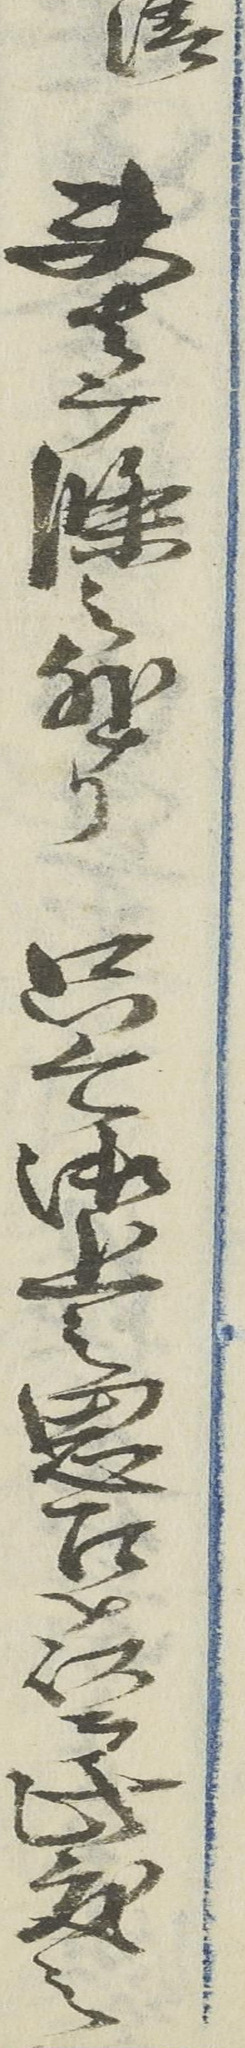清夫はケ條之外ナリ只今御上之思召ヲ以テ此度之
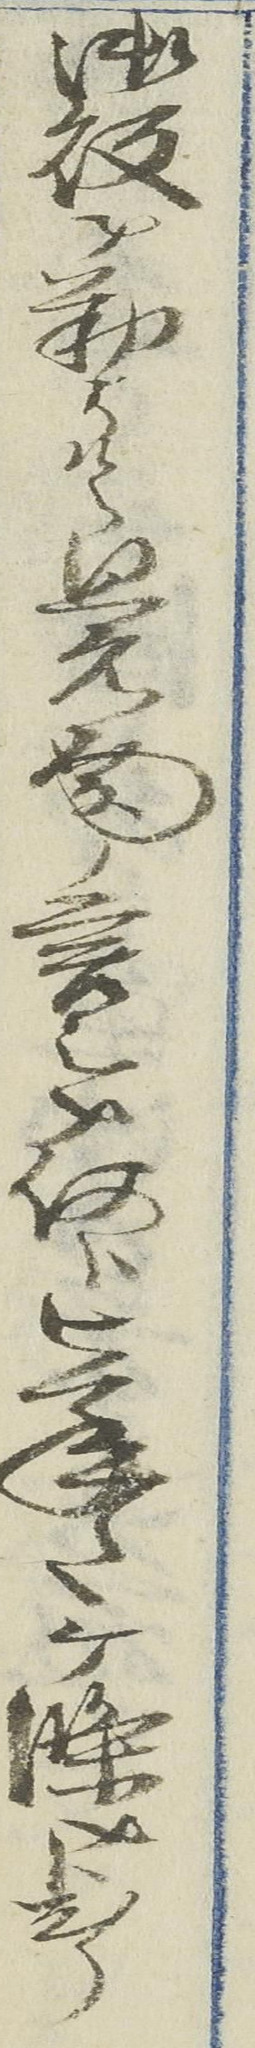御役ヲ勤ラルヽ且元殿ノ言しヲ何ト被承たケ條ヲト云う
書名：伏水大地震
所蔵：東京大学地震研究所図書室 Earthquake Research Institute Library, The University of Tokyo, JAPAN
